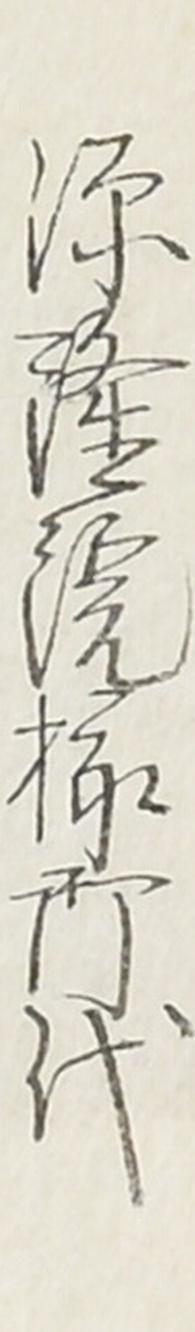源隆院様御代
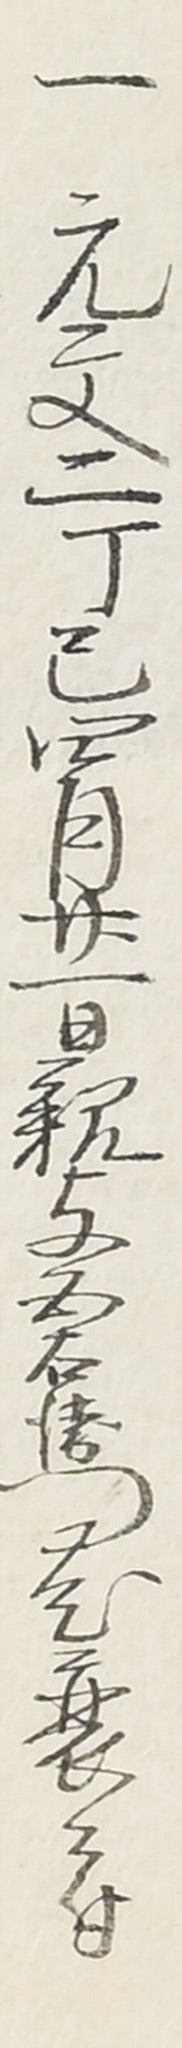一元文二丁巳四月廿一親与五右衛門老衰ニ付
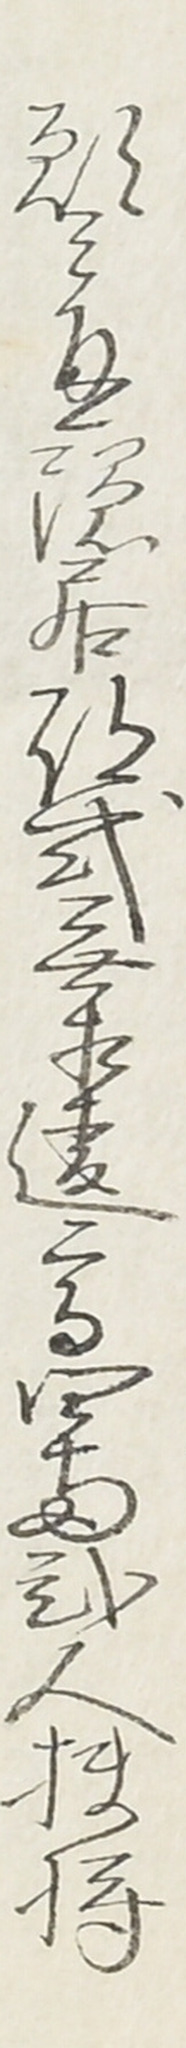願之通隠居跡式無相違高四両弐人扶持
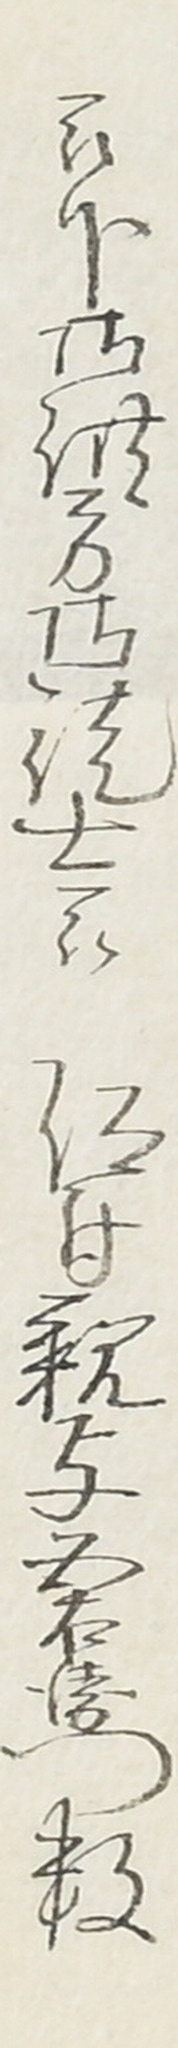被下御供方御徒士被仰付親与五右衛門数
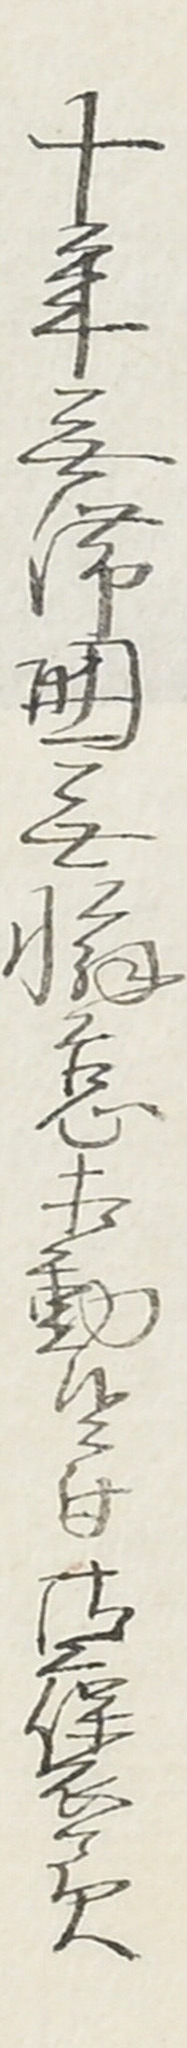十年無滞囲無懈怠相勤候二付御褒美
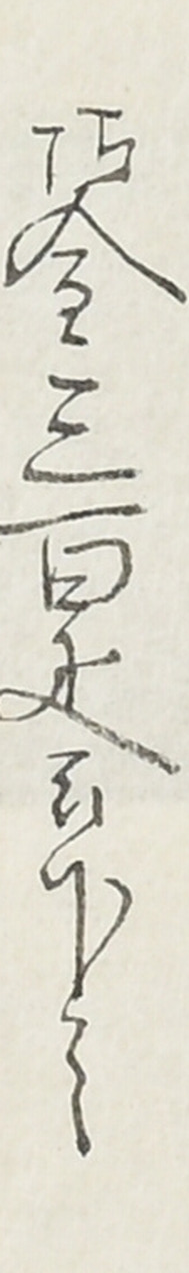御金三百疋被下之
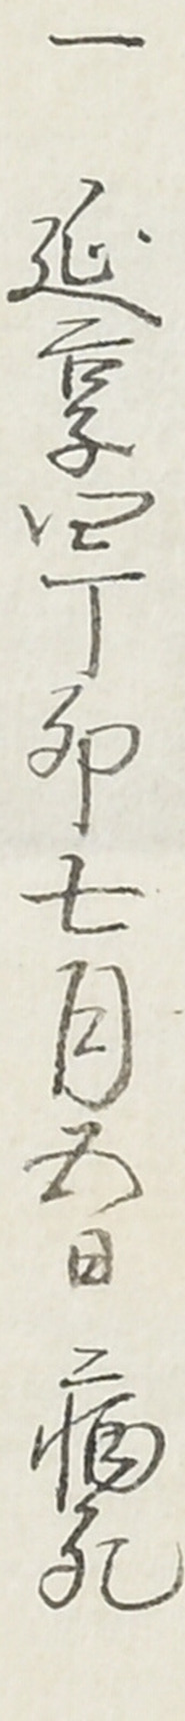一延享四丁卯七月五日病死
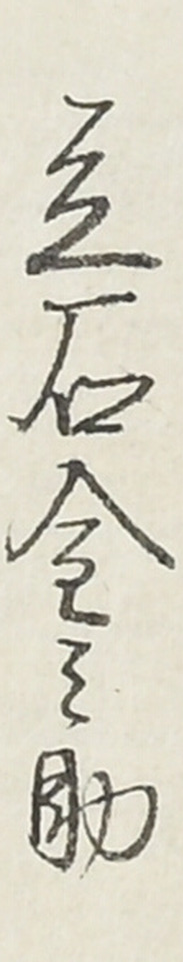立石金之助
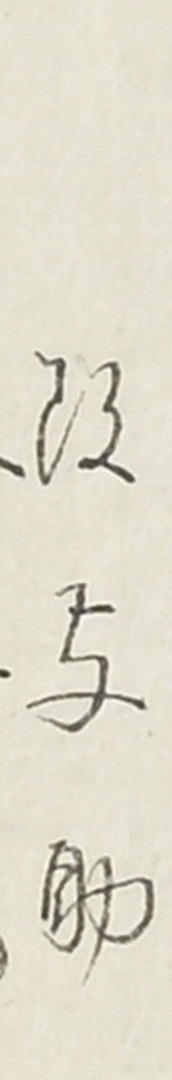後与助
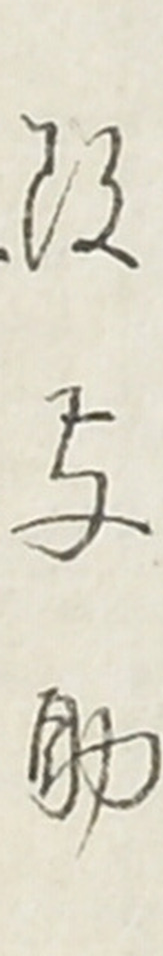後与助
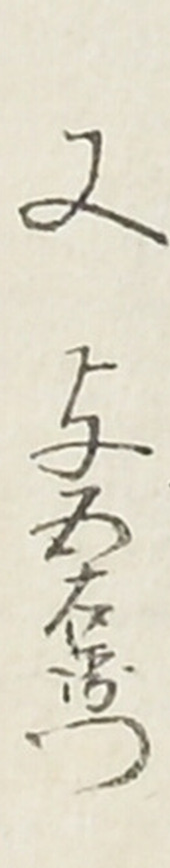又与五右衛門
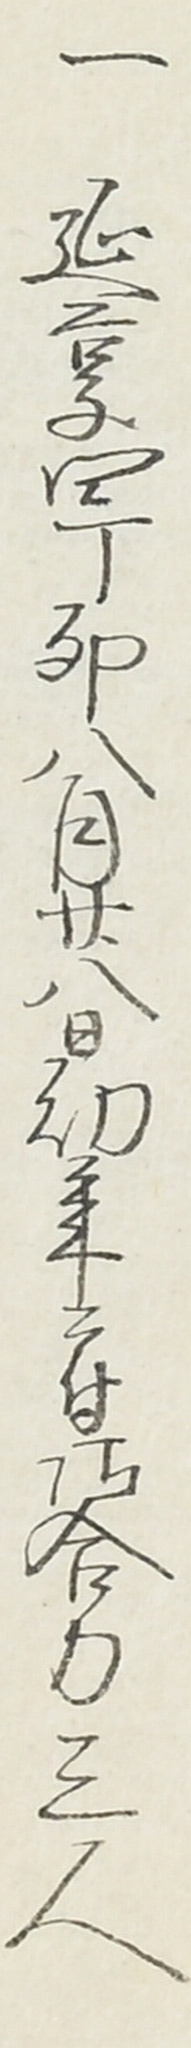一延享四丁卯八月廿八日幼年ニ付御合力三人
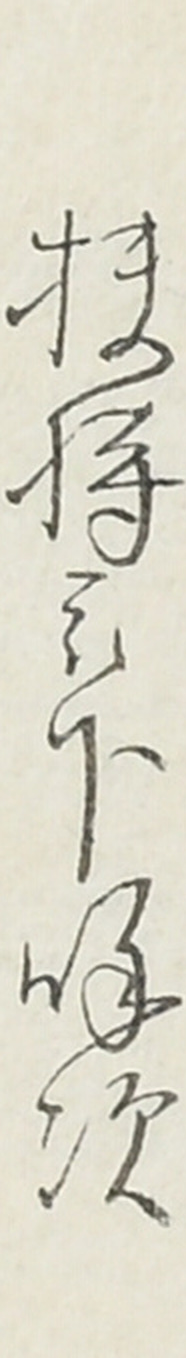扶持被下呼次
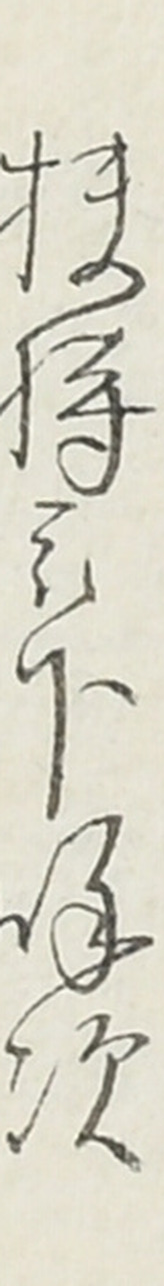扶持被下呼次
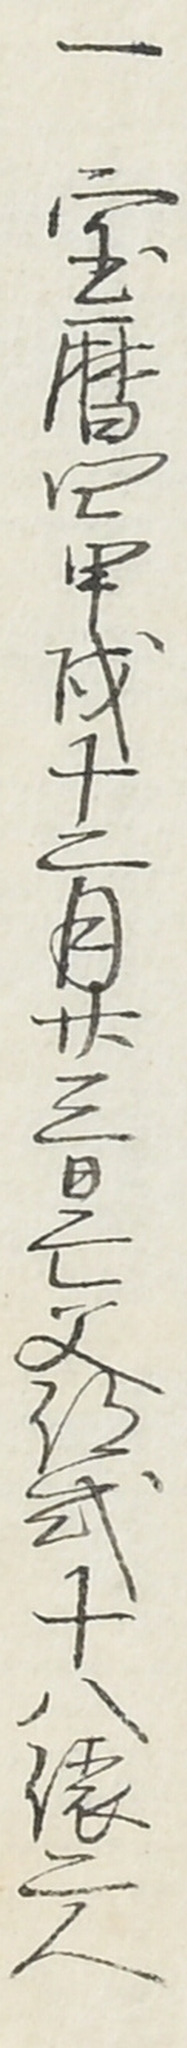一宝暦四甲戌十二月廿三日亡父跡式十八俵二人
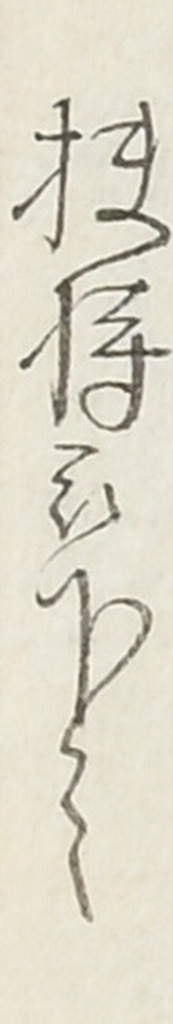扶持被下之
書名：無足諸士勤仕録（四）
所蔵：伊那市立高遠町図書館・合同会社AMANE
